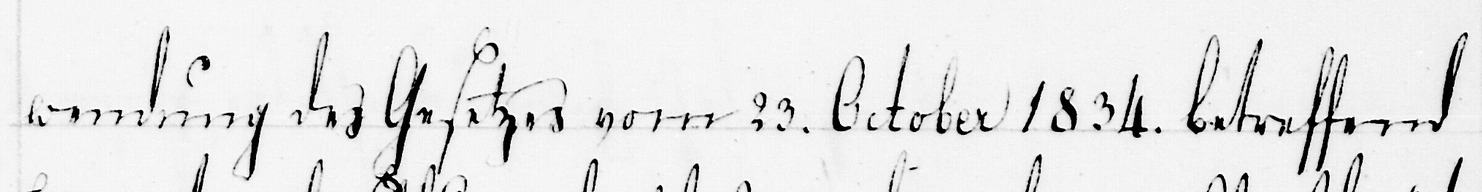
wendung des Gesetzes vom 23. October 1834. betreffend
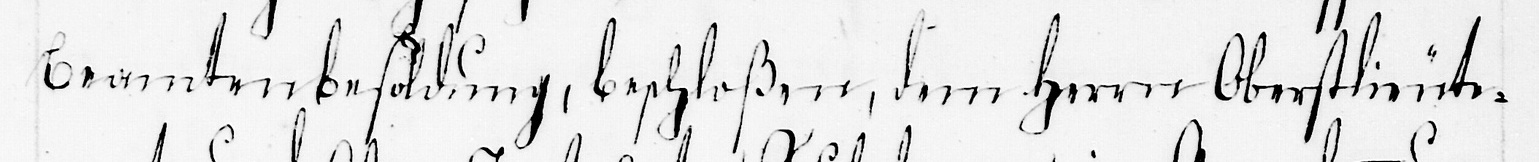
Beamtenbesoldung, beschloßen, dem Herrn Oberlieute¬
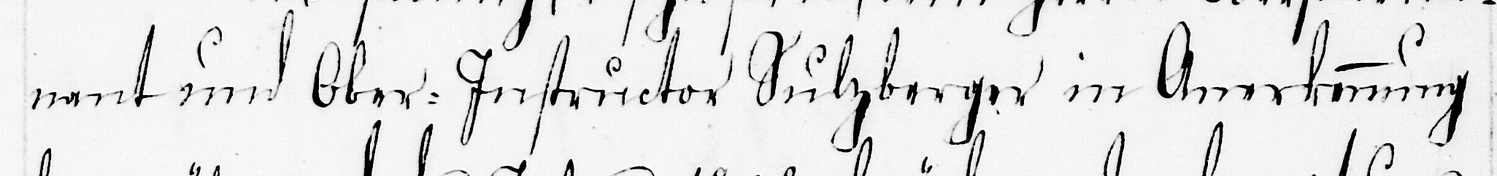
nant und Ober-Instructor Sulzberger in Anerkennung
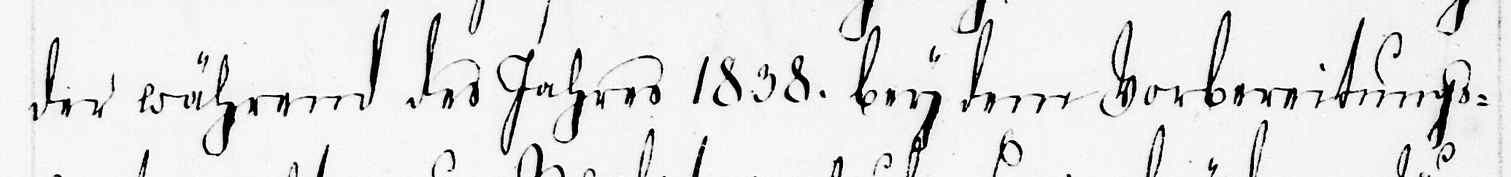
der während des Jahres 1838. bey dem Vorbereitungs¬
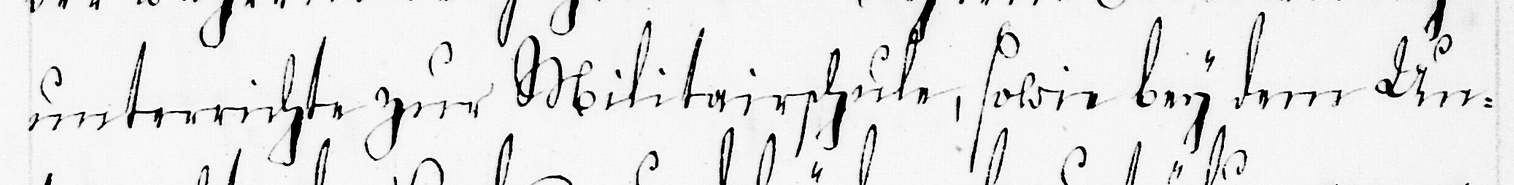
unterrichte zur Militairschule, sowie bey dem Un¬
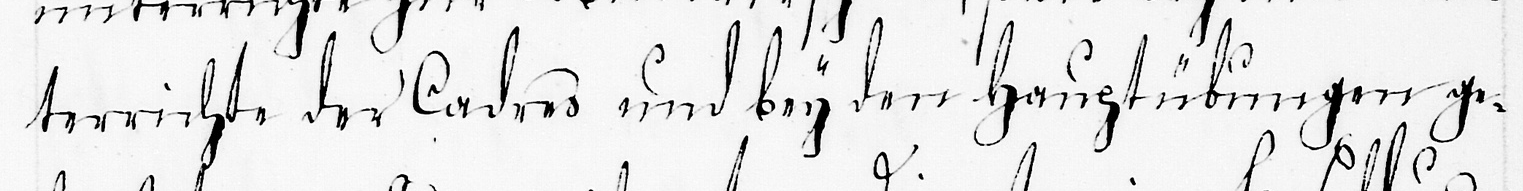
terrichte der Cadres und bey den Hauptübungen ge¬
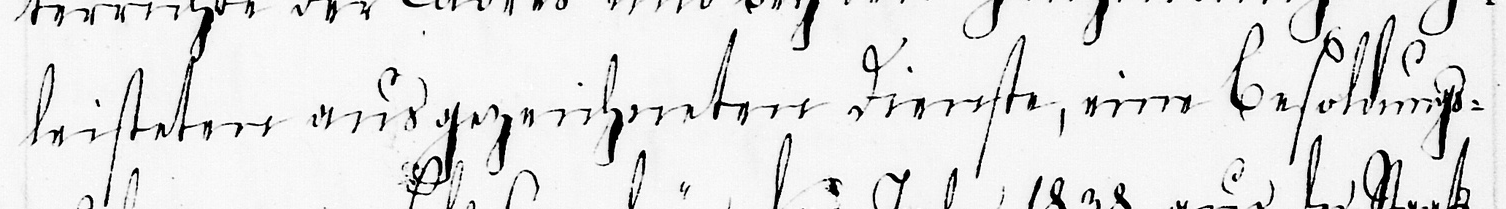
leisteten ausgezeichneten Dienste, eine Besoldungs¬
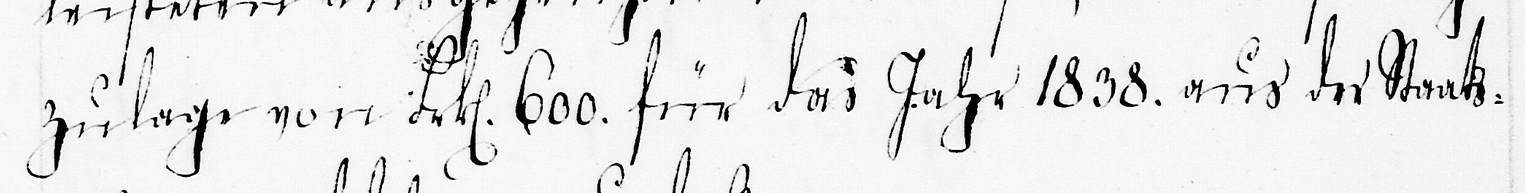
zulage von Frk[en]. 600. für das Jahr 1838. aus der Staats¬
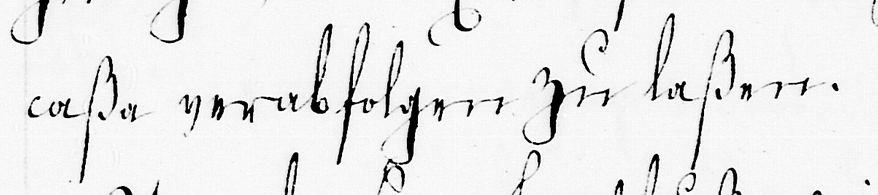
caßa verabfolgen zu laßen.
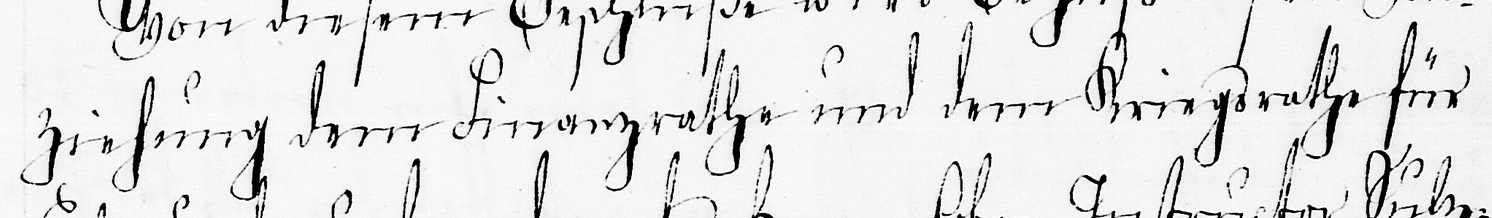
ziehung dem Finanzrathe und dem Kriegsrathe für
